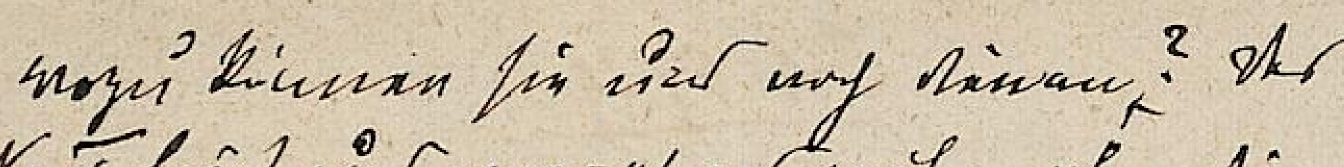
wozu können sie uns noch dienen? Das
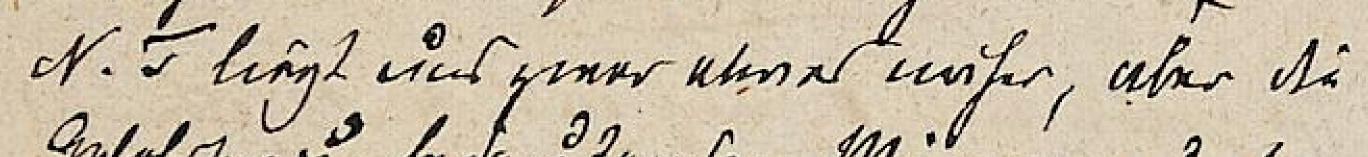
N.T liegt uns zwar etwas näher, aber die
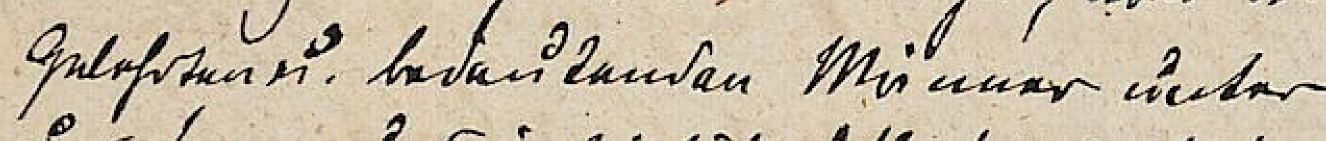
Gelehrten u. bedeutenden Männer unter
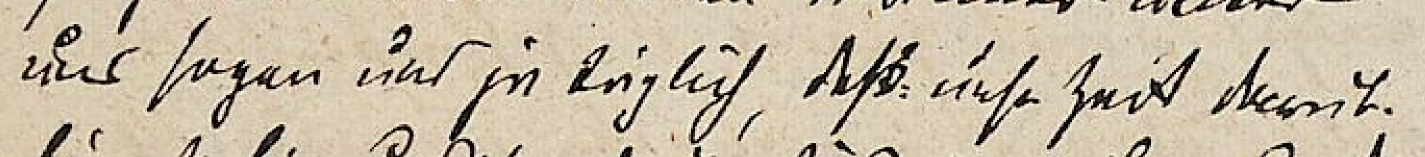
uns sagen uns ja täglich, daß: unsr Zeit darüb.
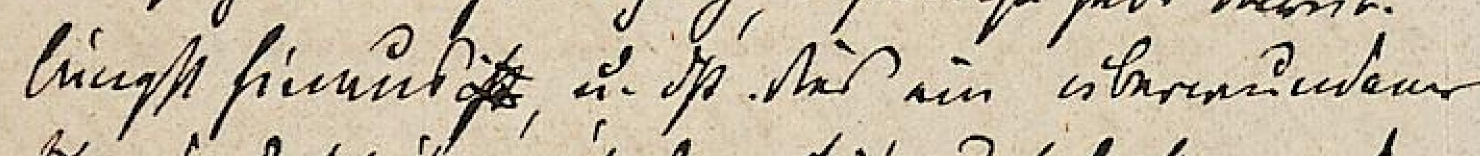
längst hinaus ist u. dß dies ein überwundener
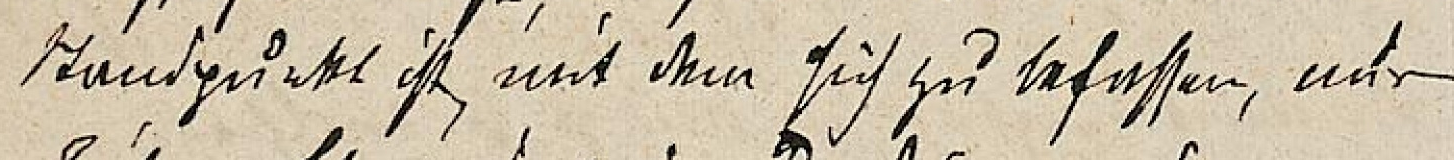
Standpunkt ist, mit dem sich zu befassen, nur
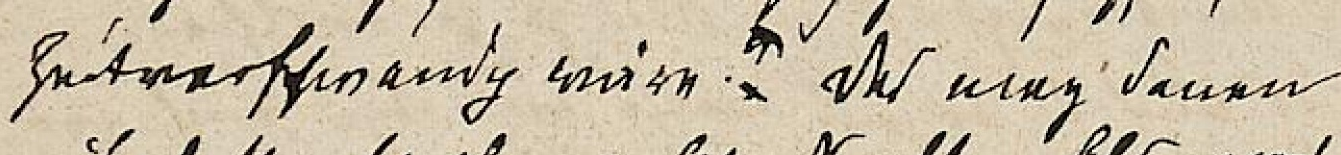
Zeitverschwendg wäre: Das mag denen
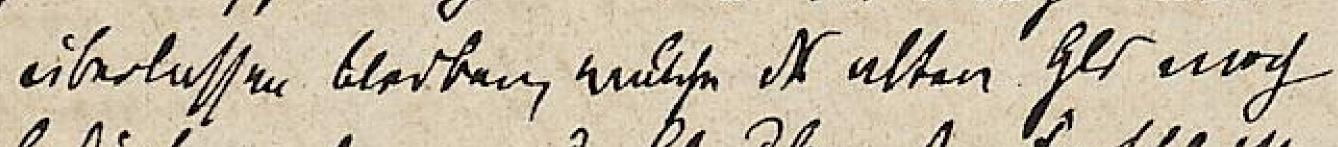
überlassen bleiben, welche ds alten Gls noch
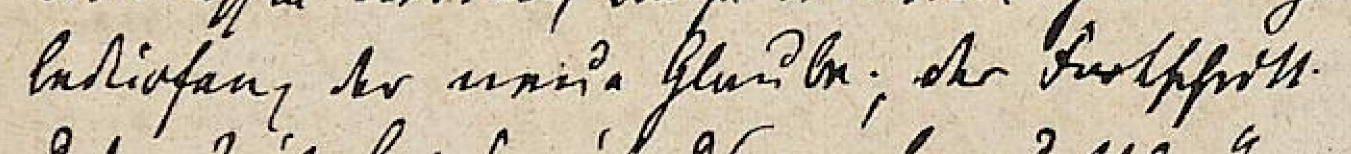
bedürfen, der neue Glaube; der Fortschritt
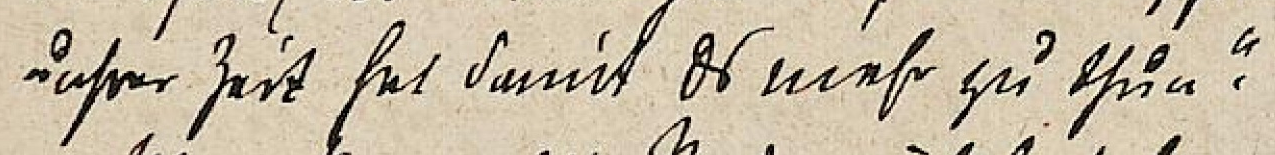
unsrer Zeit hat damit os mehr zu thun.
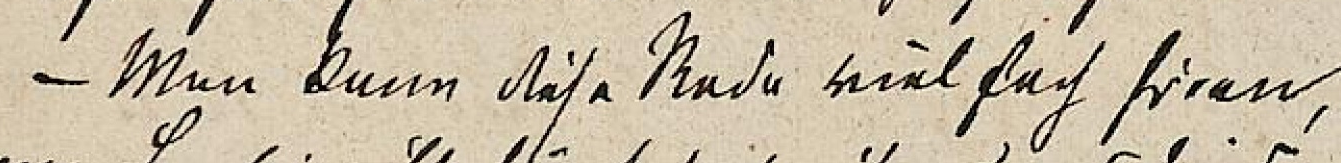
_ Man Kann diese Rede vielfach hören,
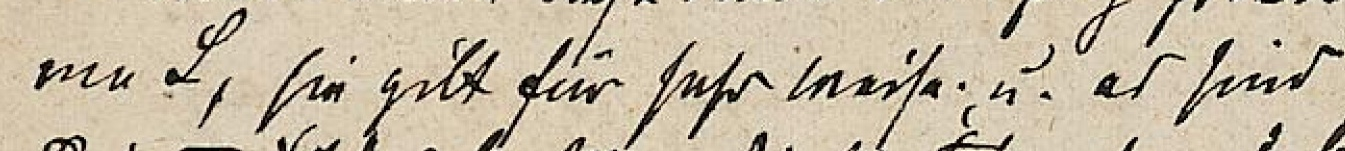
mn L, sie gilt für sehr weise u. es sind
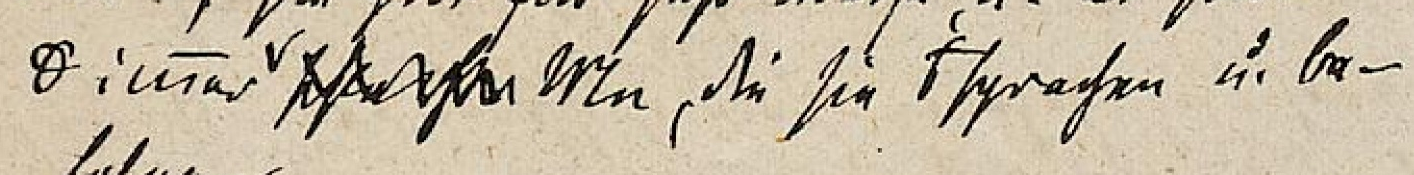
o imer schon ehe Mn, die sie ssprachen u. be¬
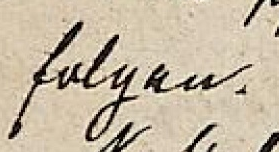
folgen.
